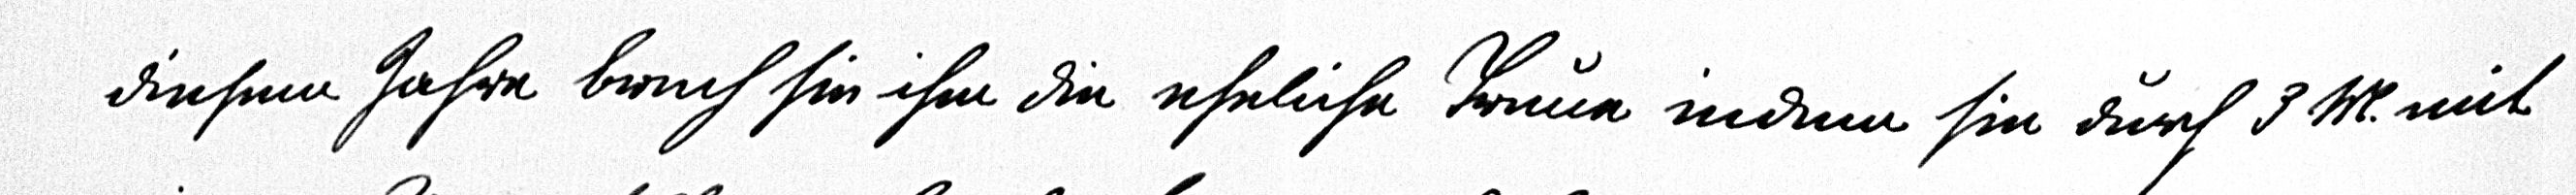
diesem Jahre brech sie ihm die eheliche Treue indem sie durch 3 M. mit
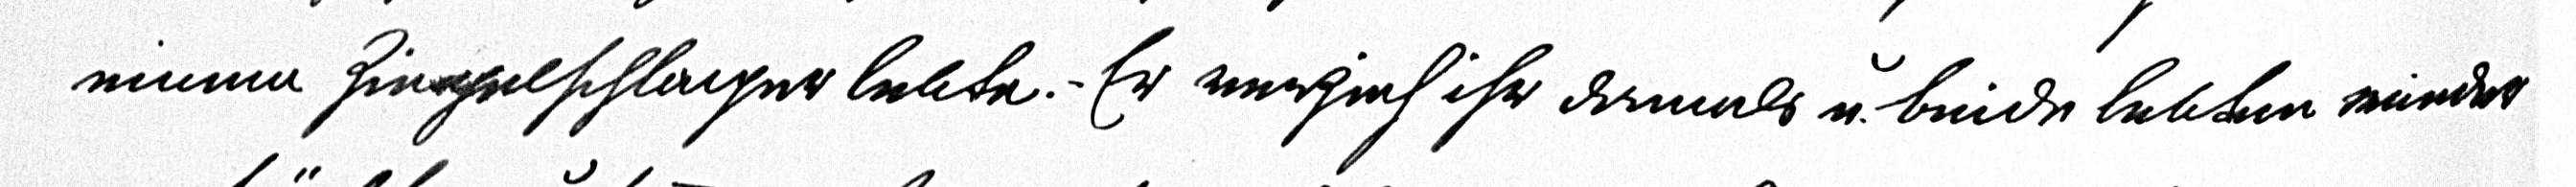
einem Zingelschlager lebte. - Er verzieh ihr damals u. beide lebten wunder
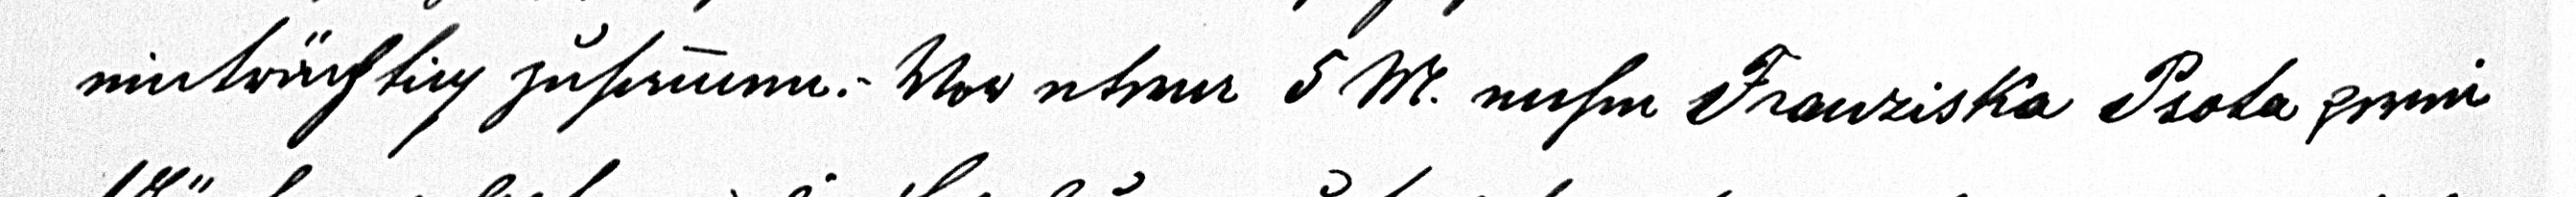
einträchtig zusammen. - Vor etwa 5 M. nehm Franziska Psota zwei
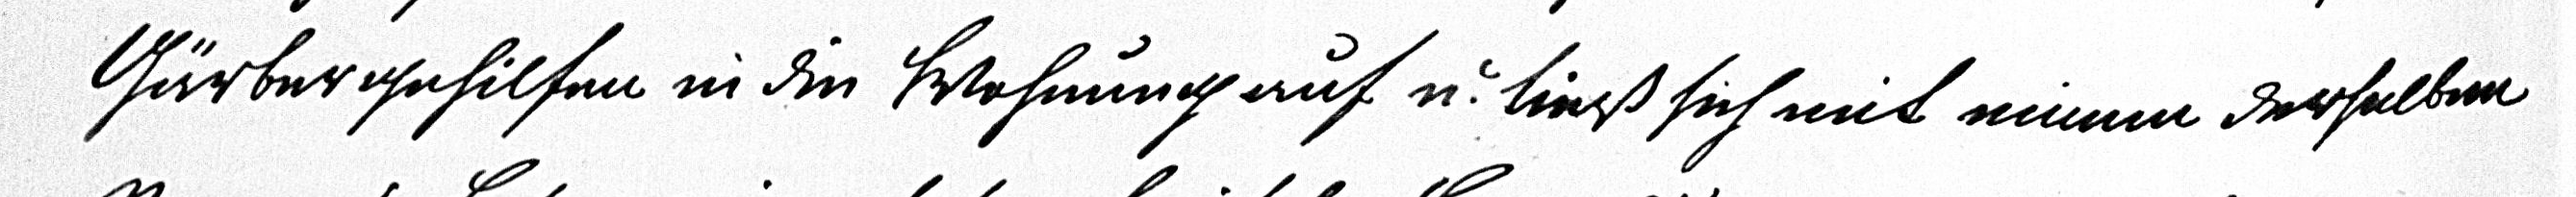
Gärbergehilfen in die Wohnung auf u. ließ sich mit einem derselben
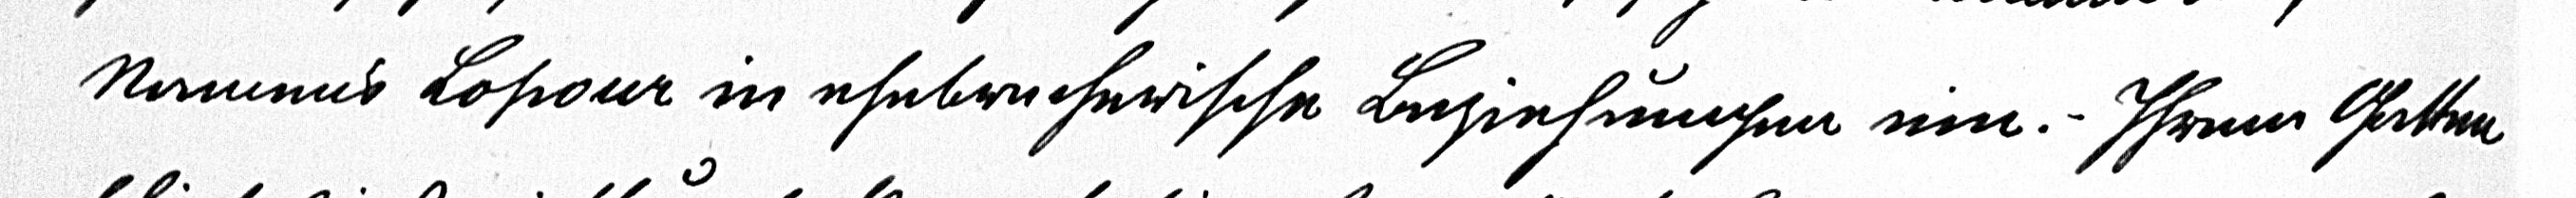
Namens Lopour in ehebrecherische Beziehungen ein. - Ihrem Gatten
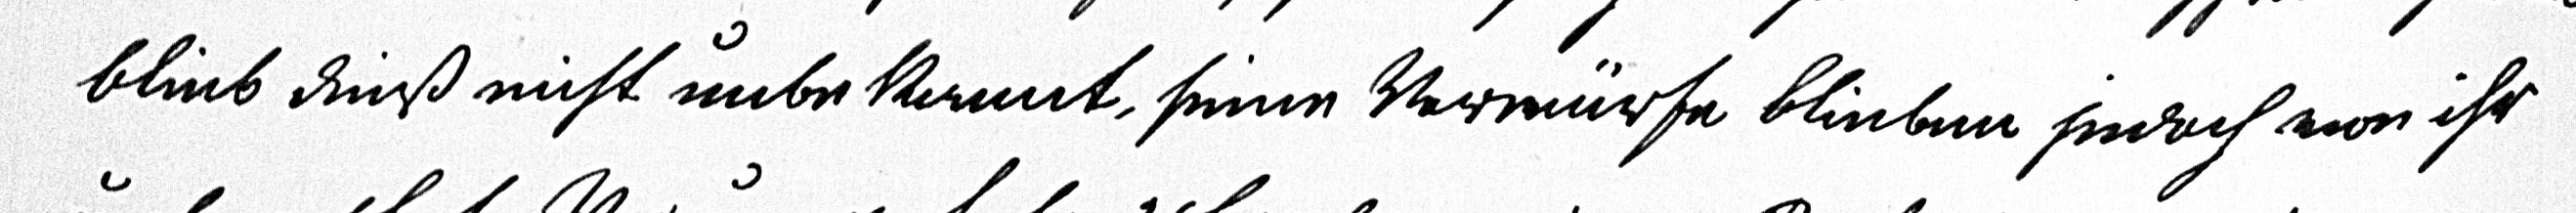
blieb dieß nicht unbe Kannt, seine Verwürfe blieben jedoch von ihr
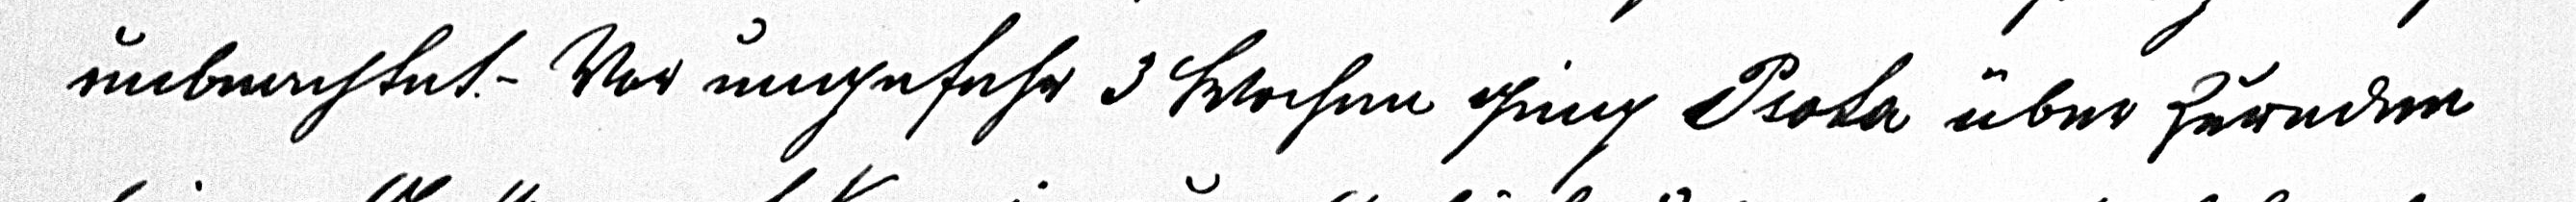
unbeachtet. - Vor ungefahr 3 Wochen ging Psota über Zureden
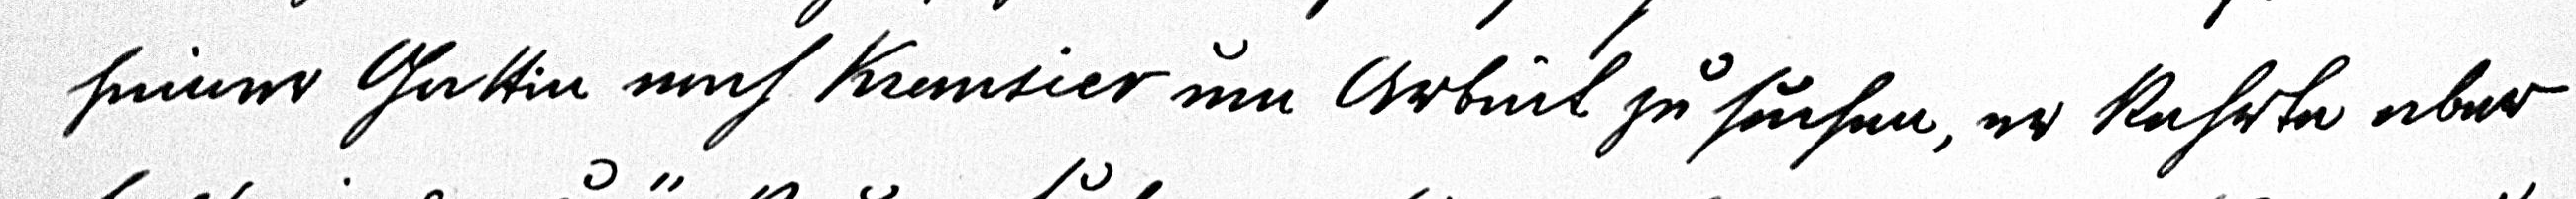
seiner Gattin nach Krantier um Arbeit zu suchen, er Kehrte aber
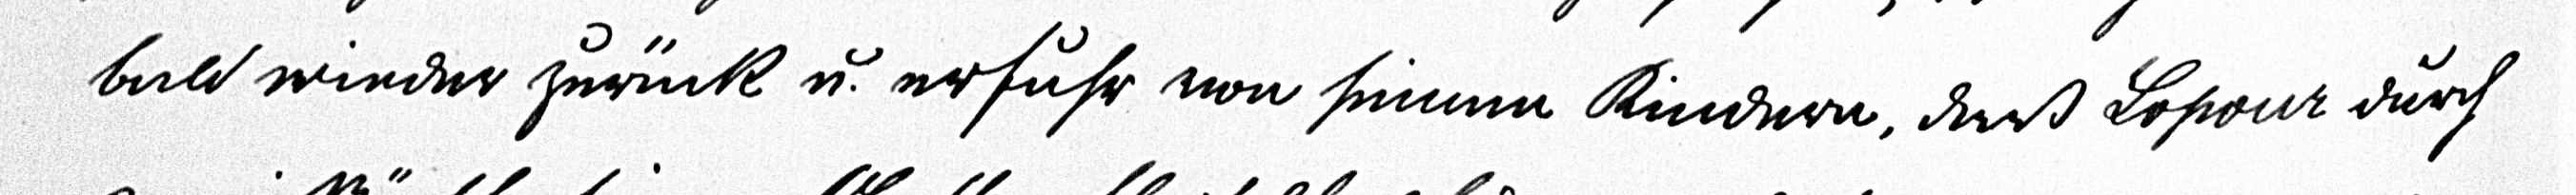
bald wieder zurück u. erfuhr von seinem Kindern, daß Lopour durch
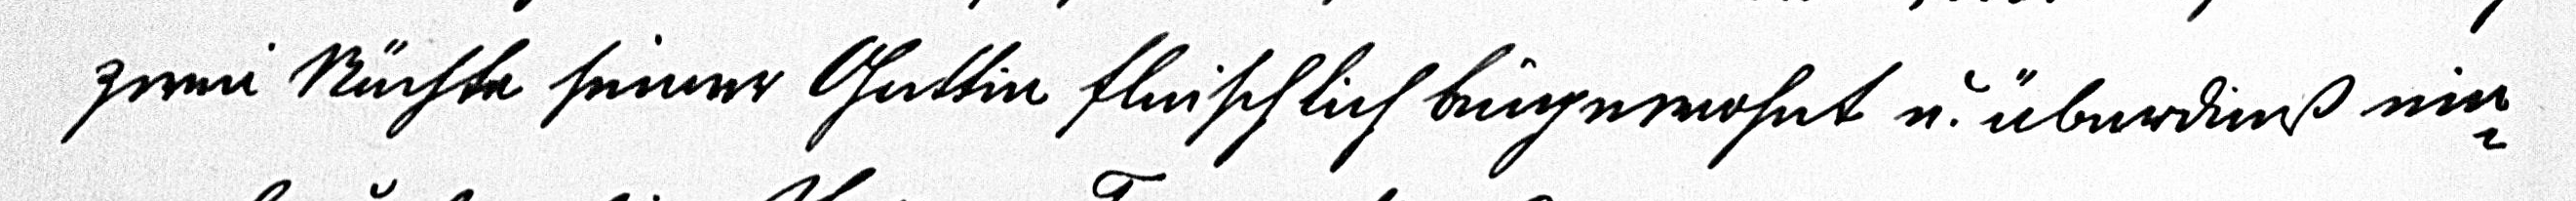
zwei Nächte seiner Gattin fleischlich bürgewohet u. überdies ein¬
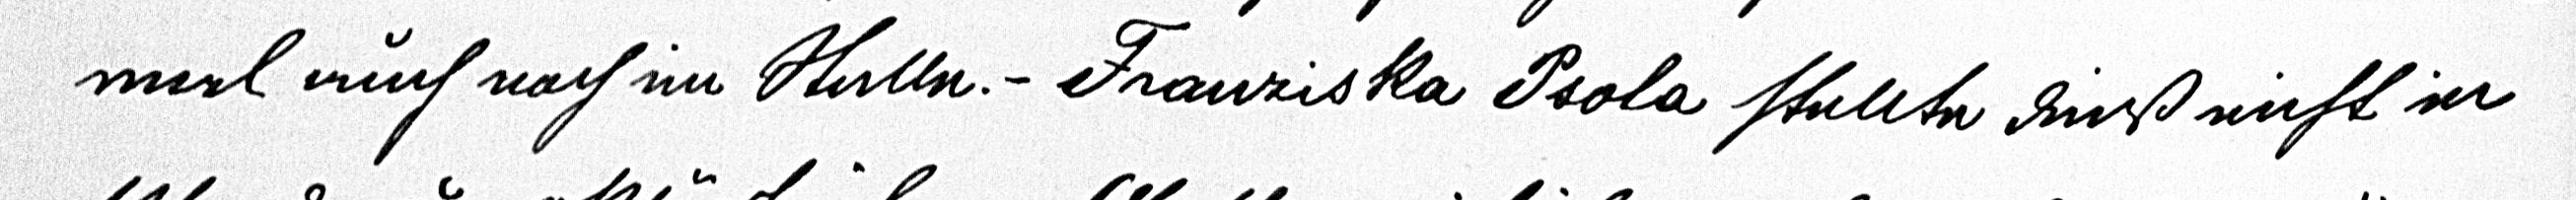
mal auch noch im Statte. - Franziska Psola stellte dies eicht in
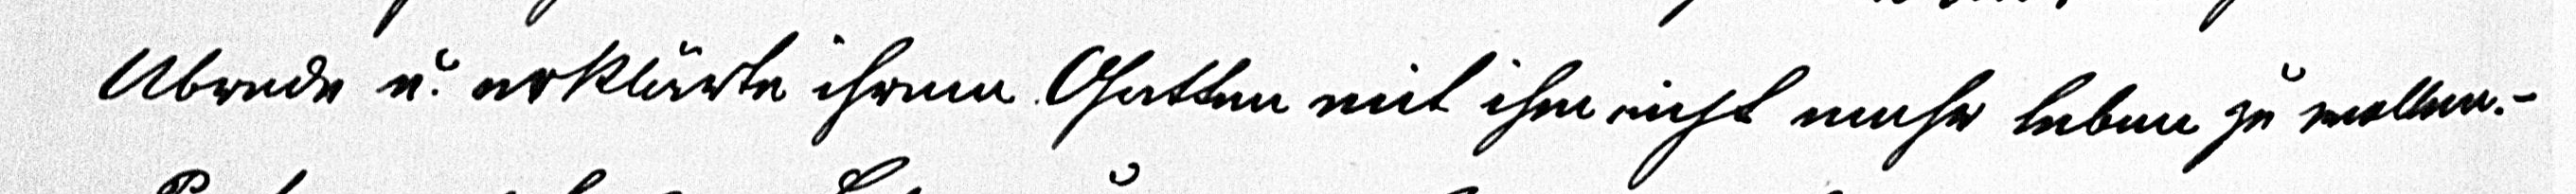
Abrede u. erklärte ihrem. Gatten mit ihm nicht mehr leben zu wallen. -
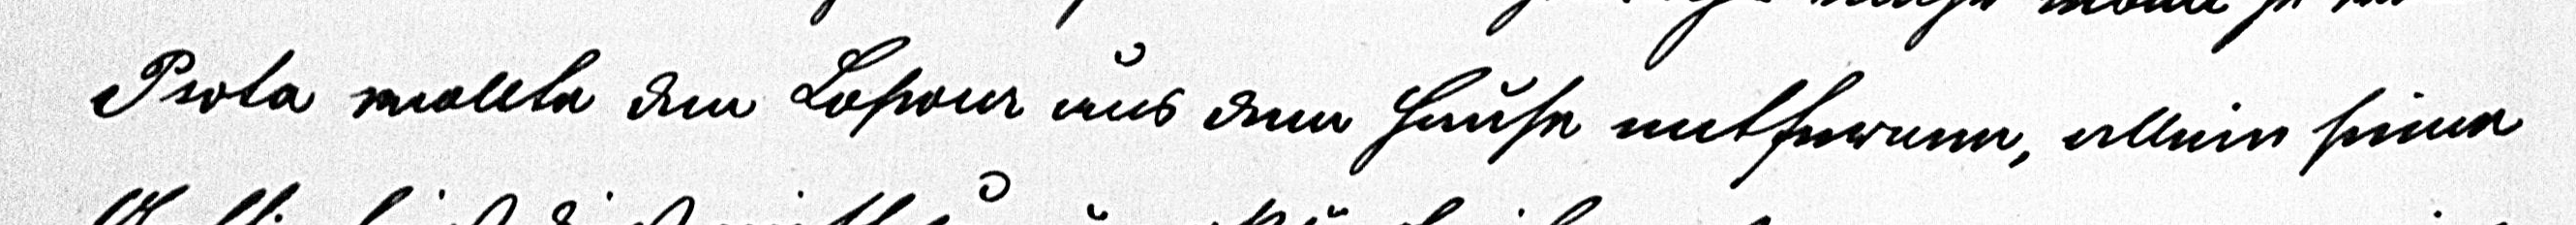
Psola wollte am Lopour aus dem Hause entfernen, allein seine
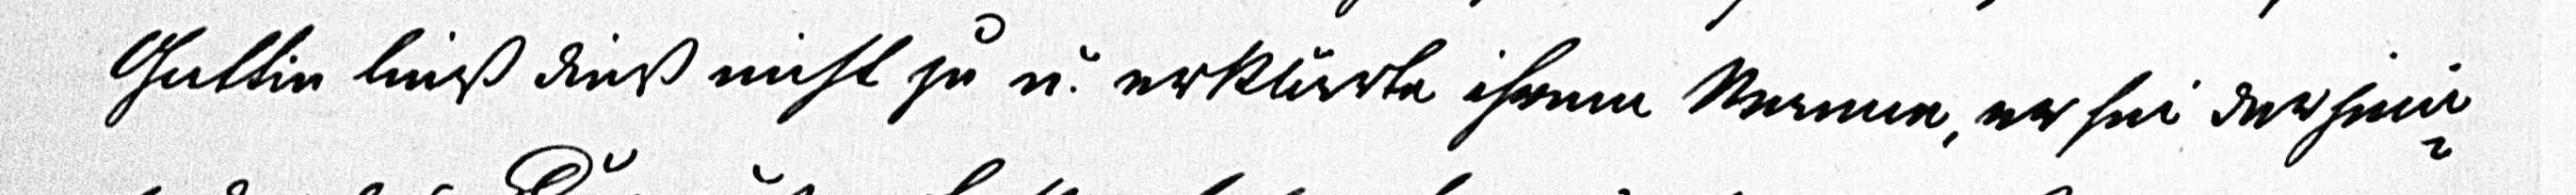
Gattin ließ dieß nicht zu u. erklärte ihrem Manen, er sei der hein¬
